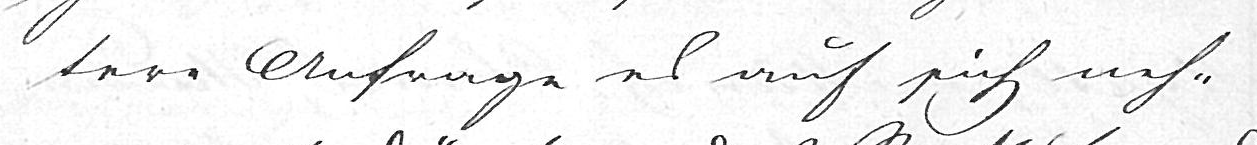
tere Anfrage es auf sich neh-
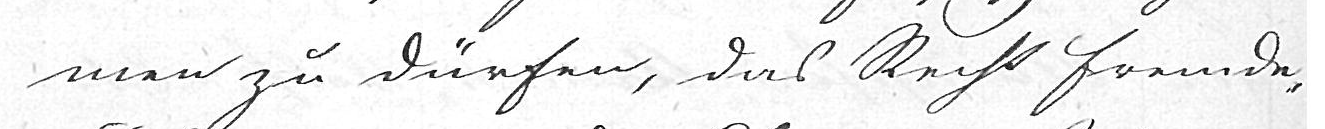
men zu dürfen, das Recht Fremde,
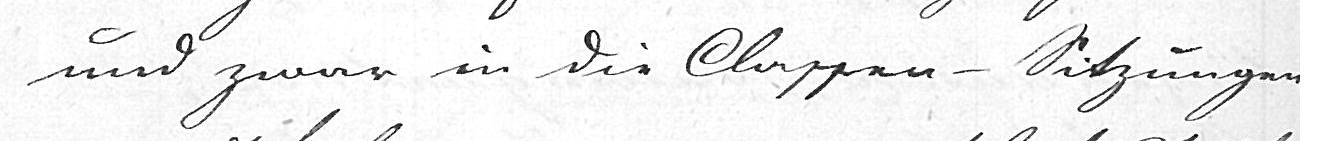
und zwar in die Classen-Sitzungen
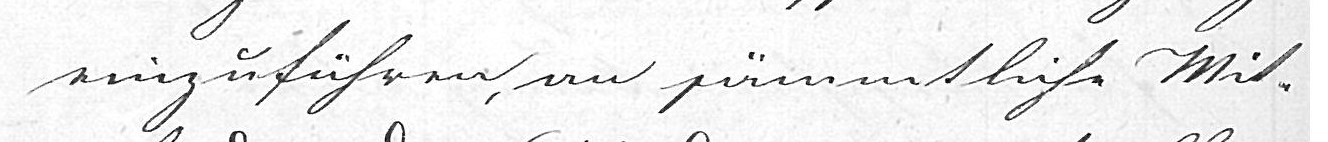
einzuführen, an sämmtliche Mit-
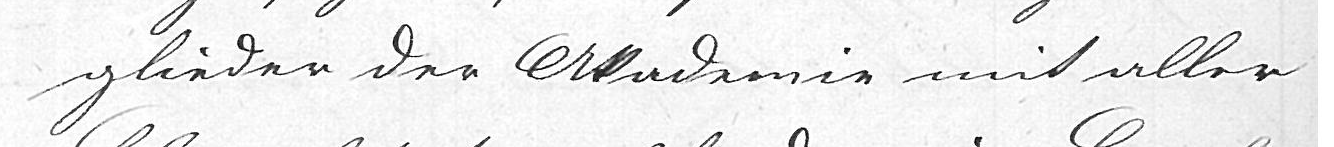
glieder der Akademie mit aller
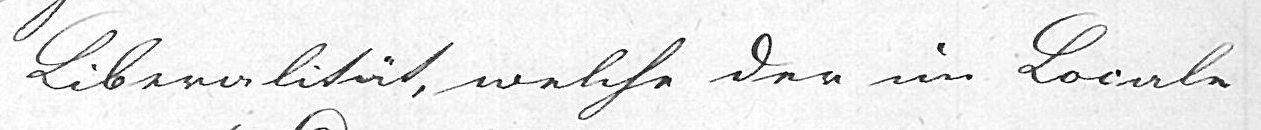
Liberalität, welche der im Locale
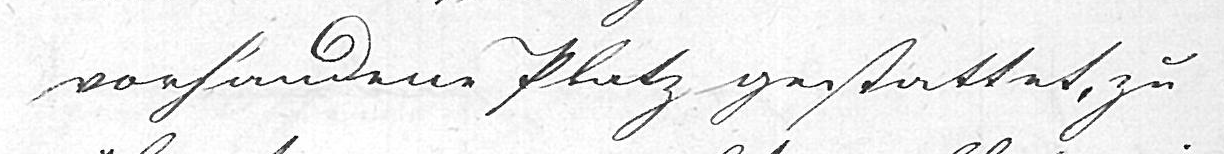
vorhandene Platz gestattet, zu
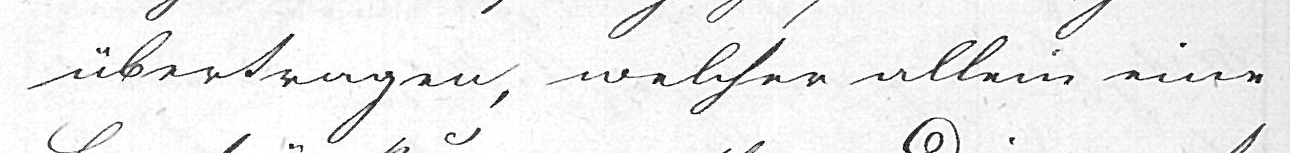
übertragen, welcher allein eine
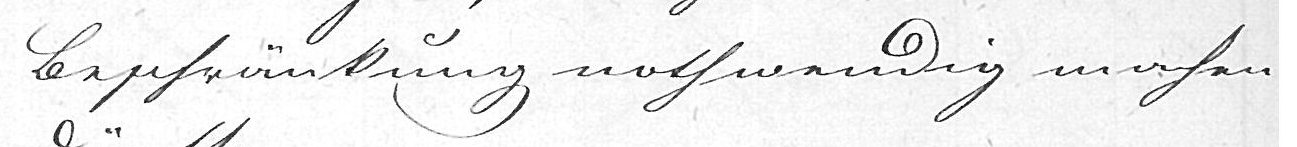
Beschränkung nothwendig machen
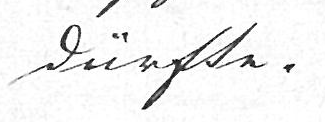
dürfte.
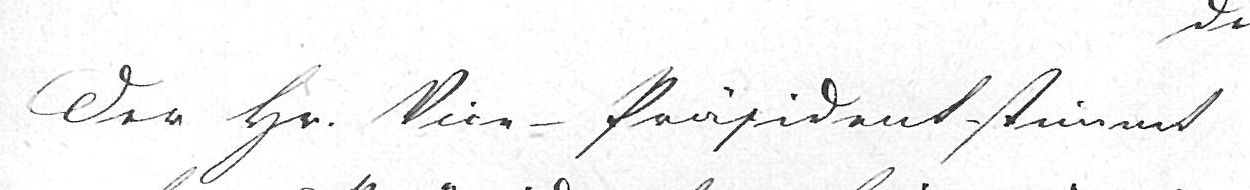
Der Hr. Vice-Präsident stimmt
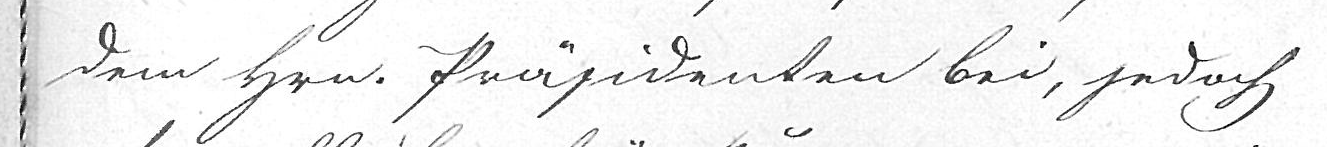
dem Hrn. Präsidenten bei, jedoch
